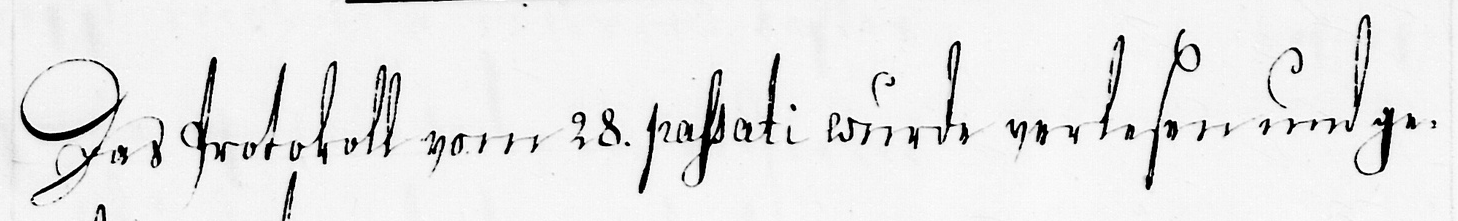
Das Protokoll vom 28. passati wurde verlesen und ge¬
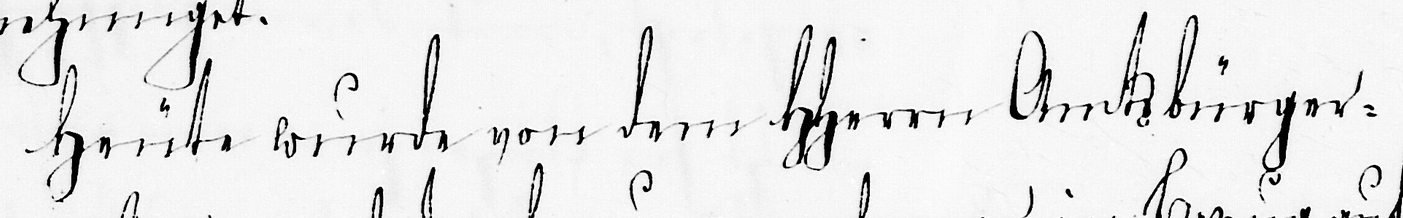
Heute wurde von dem HHerrn Amtsbürger¬
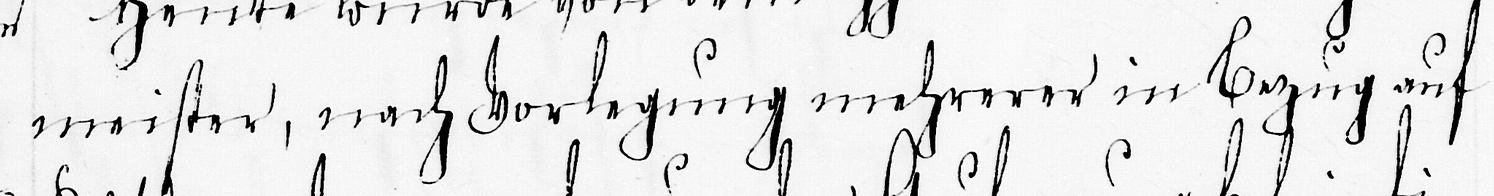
meister, nach Vorlegung mehrerer in Bezug auf
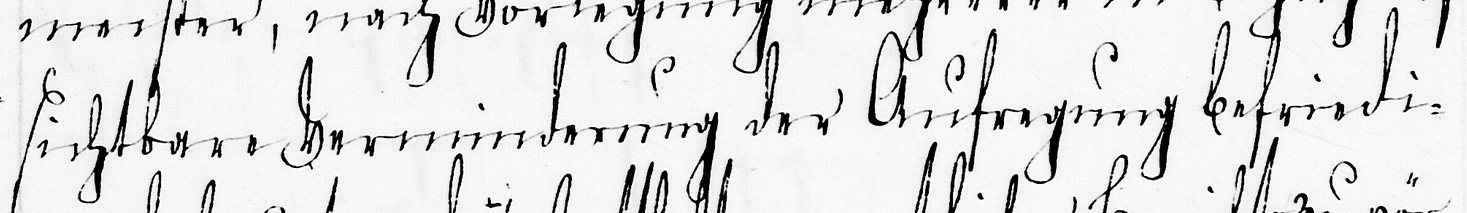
sichtbare Verminderung der Aufregung befriedi¬
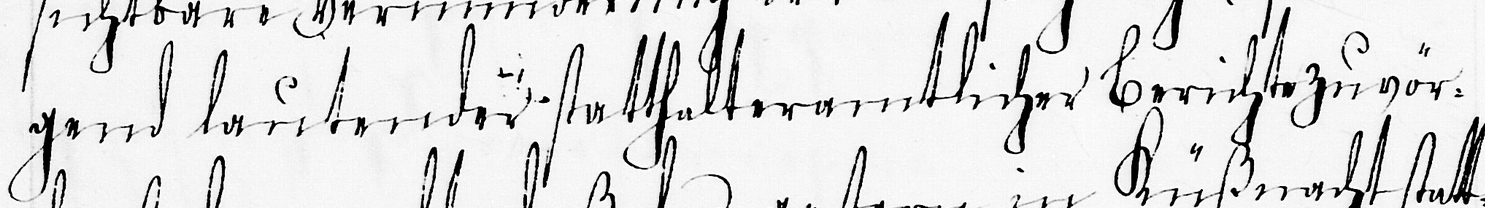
gend lautender statthalteramtlicher Berichte zuvör¬
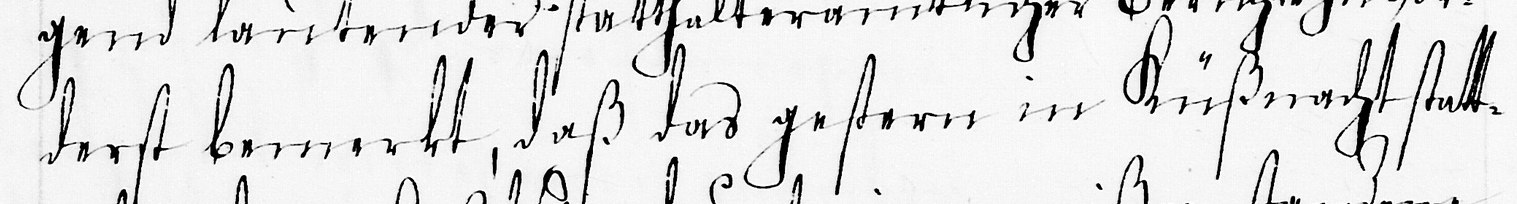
derst bemerkt, daß das gestern in Küßnacht stat¬
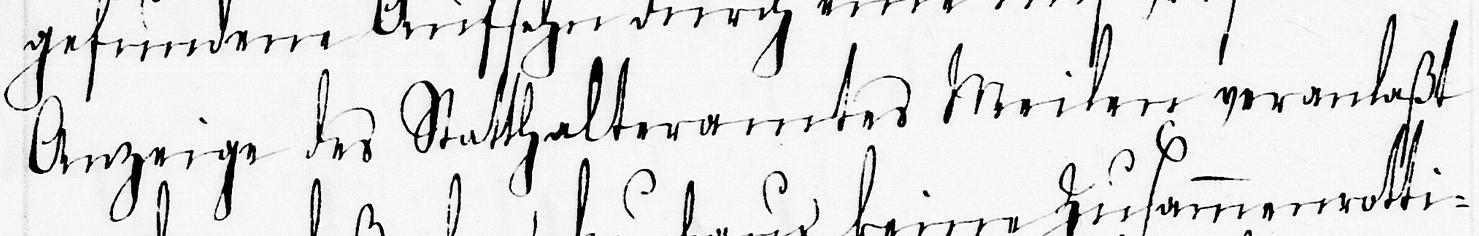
Anzeige des Statthalteramtes Meilen veranlaßt
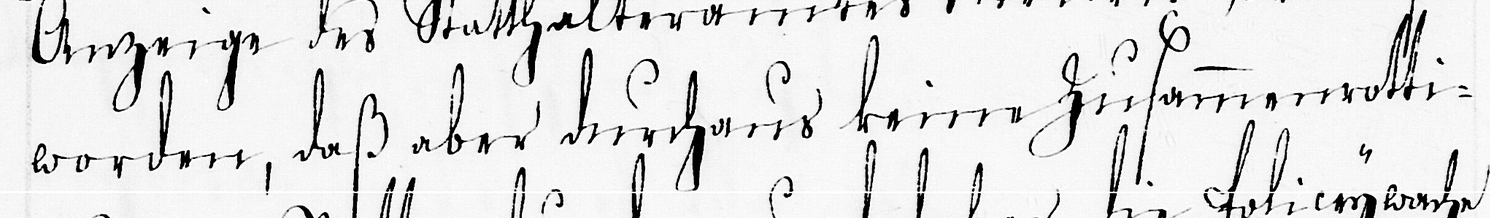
worden, daß aber durchaus keine Zusammenrotti¬
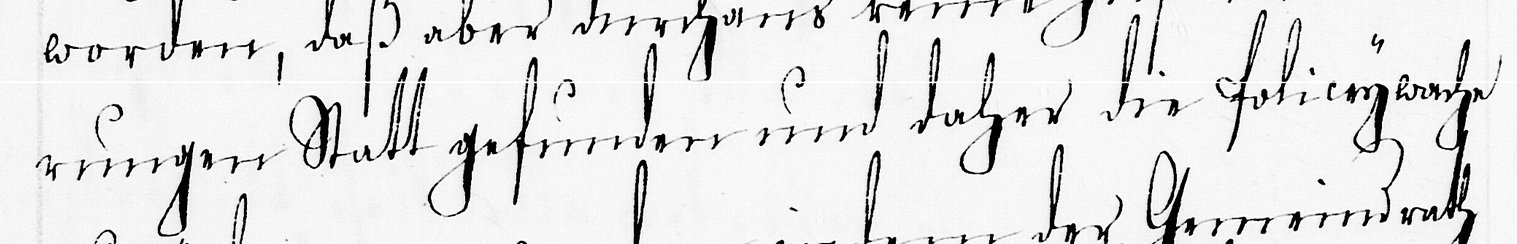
rungen Statt gefunden und daher die Policeywac¬
